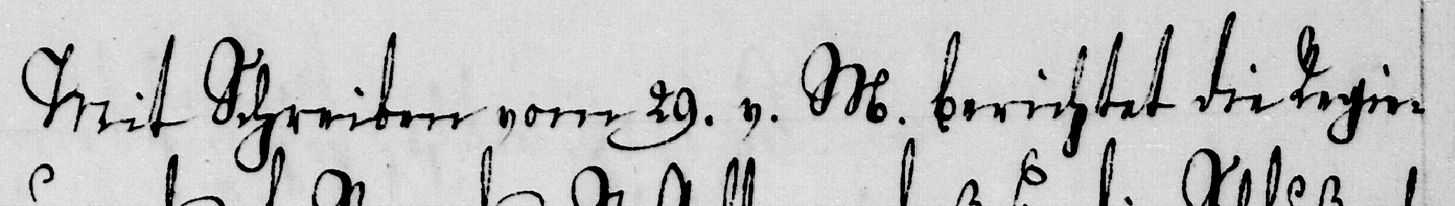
Mit Schreiben vom 29. v. M. berichtet die Regie¬
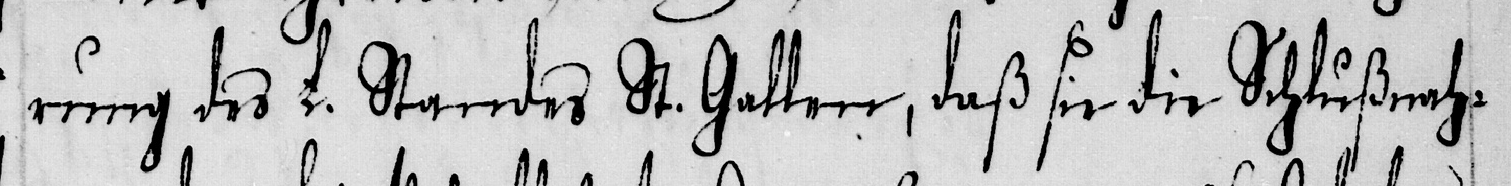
rung des L. Standes St. Gallen, daß sie die Schlußnah¬
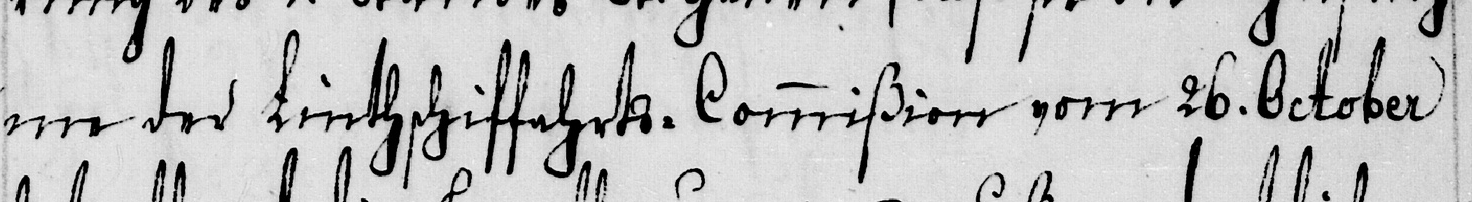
me der Linthschiffahrts-Commißion vom 26. October
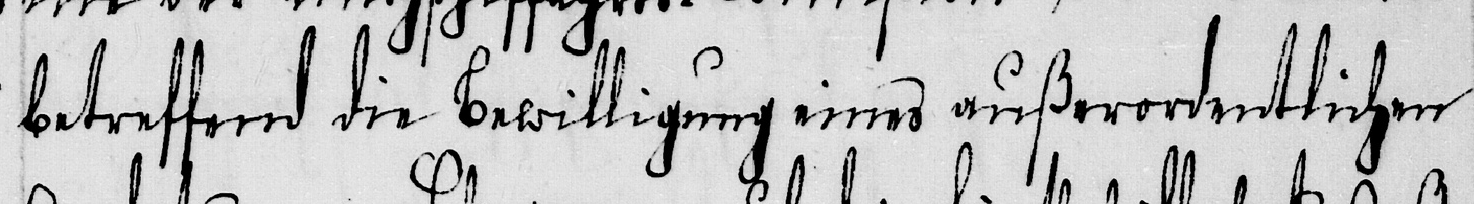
betreffend die Bewilligung eines außerordentlichen
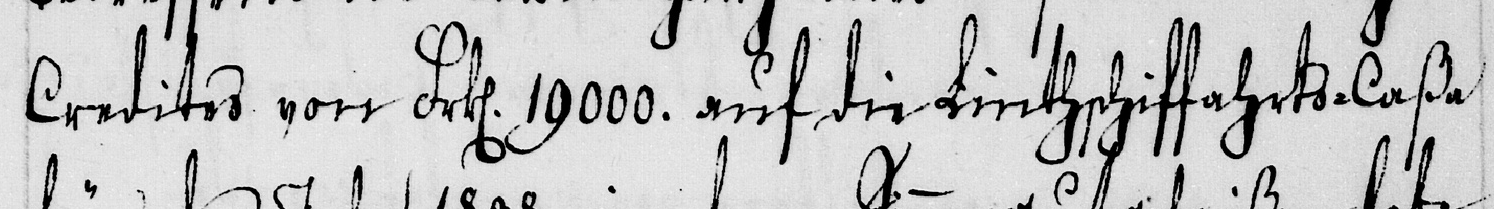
Credites von Frk[en]. 19000. auf die Linthschiffahrts-Caßa
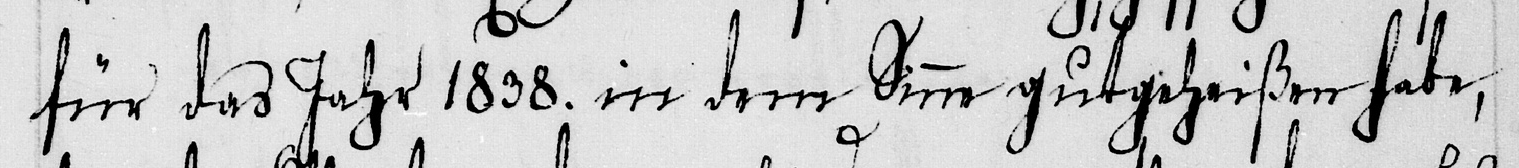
für das Jahr 1838. in dem Sinne gutgeheißen habe,
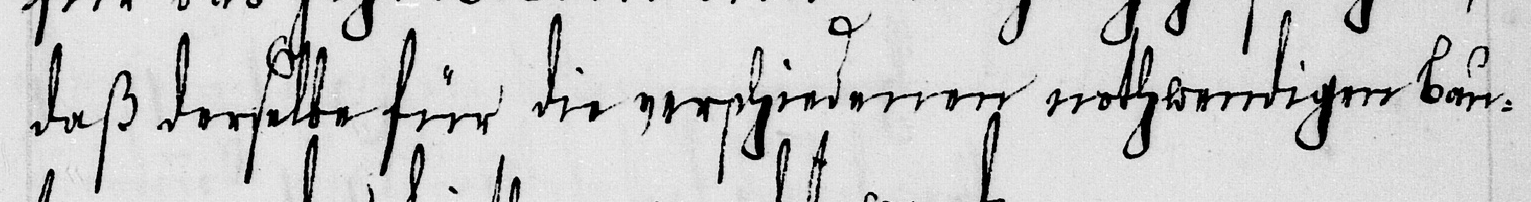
daß derselbe für die verschiedenen nothwendigen Bau¬
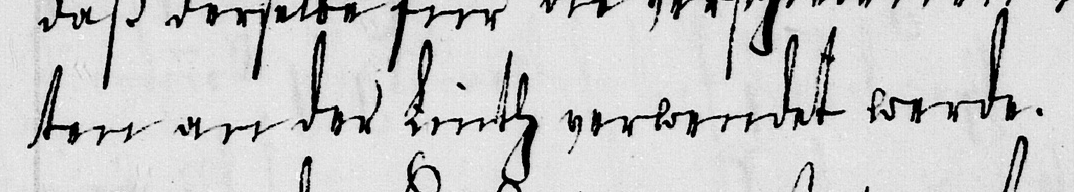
ten an der Linth verwendet werde.
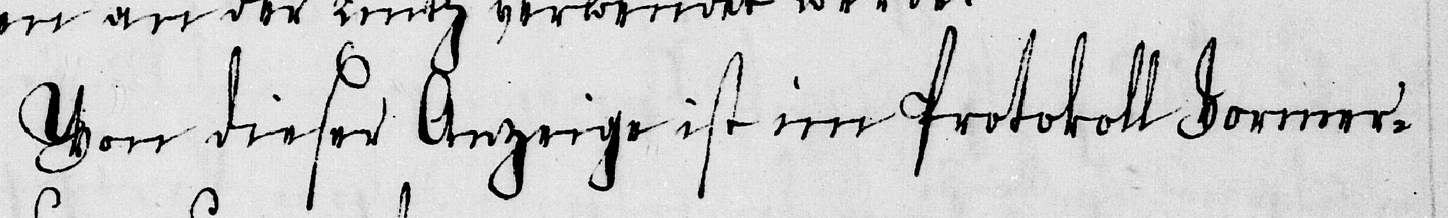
Von dieser Anzeige ist im Protokoll Vormer¬
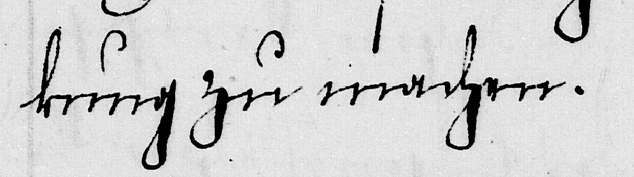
kung zu machen.
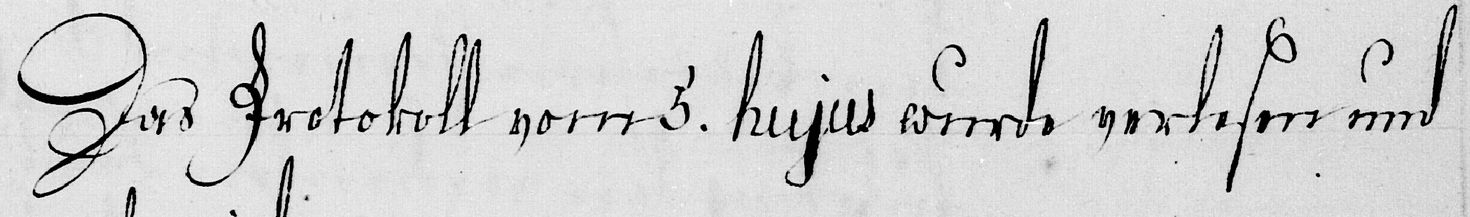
Das Protokoll vom 5. hujus wurde verlesen und
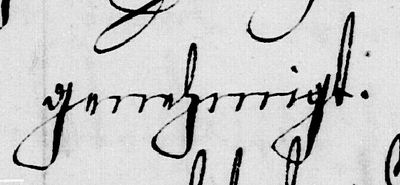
genehmigt.
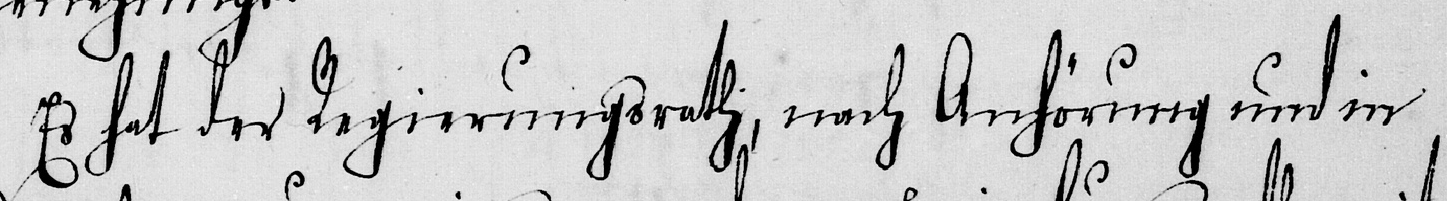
Es hat der Regierungsrath, nach Anhörung und in
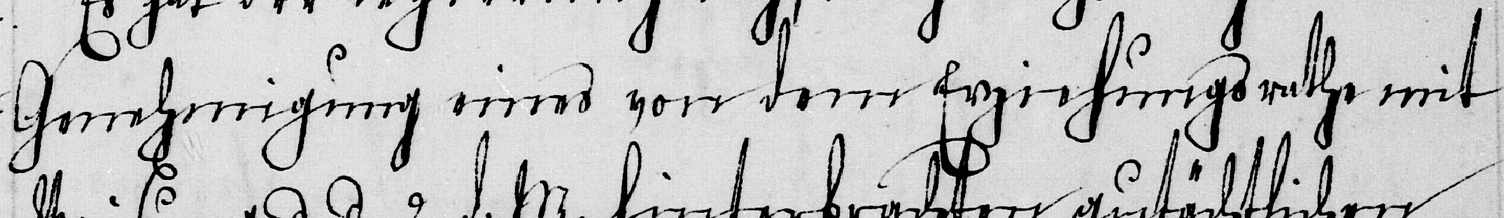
Genehmigung eines von dem Erziehungsrathe mit
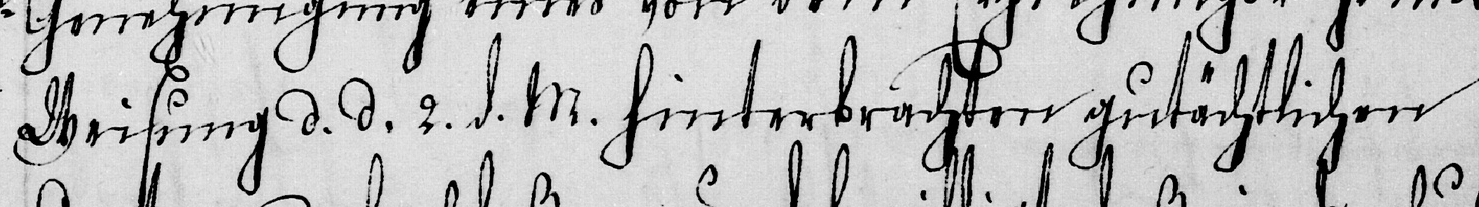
Weisung d. d. 2. d. M. hinterbrachten gutächtlichen
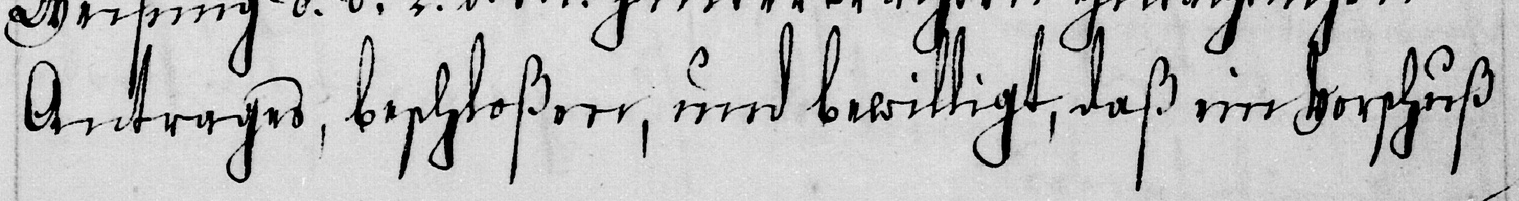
Antrages, beschloßen, und bewilligt, daß ein Vorschuß
